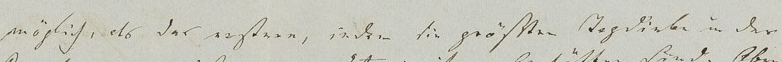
möglich, als das erstere, indem die größten Tagdiebe in der
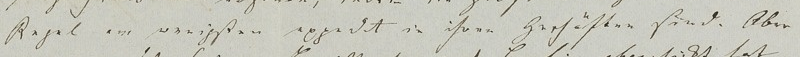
Regel am wenigsten expedit in ihren Geschäften sind. Aber
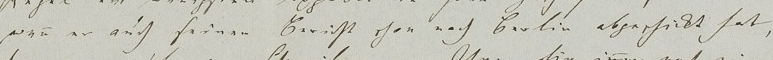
wenn er auch seinen Bericht schon nach Berlin abgeschickt hat,
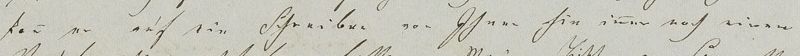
kann er auf ein Schreiben von Ihnen hin immer noch einen
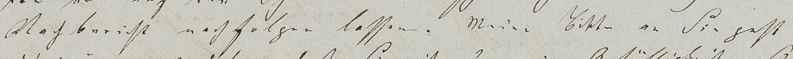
Nachbericht nachfolgen lassen. Meine Bitte an Sie geht
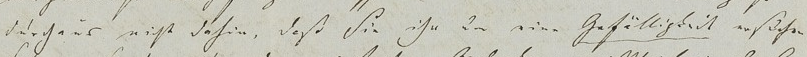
durchaus nicht dahin, dass Sie ihn um eine Gefälligkeit ersuchen
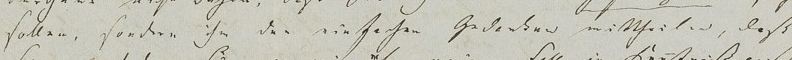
sollen, sondern ihm den einfachen Gedanken mittheilen, daß
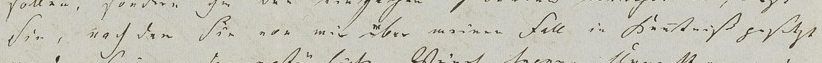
Sie, nachdem Sie von mir über meinen Fall in Kenntniß gesetzt
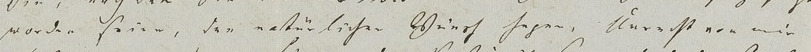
worden seien, den natürlichen Wunsch hegen, Unrecht von mir
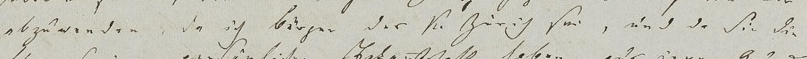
abzuwenden, da ich Bürger des K. Zürich sei, und da Sie die
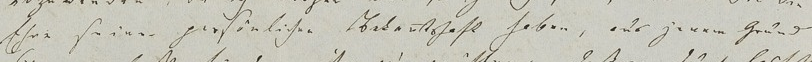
Ehre seiner persönlichen Bekanntschaft haben, aus jenem Grund
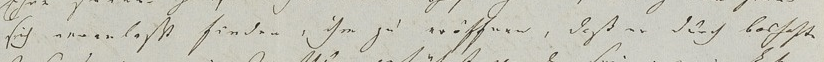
sich veranlaßt finden, ihm zu eröffnen, daß er durch boshafte
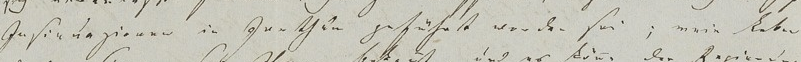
Insinuazionen in Irrthum geführt worden sei; mein Leben
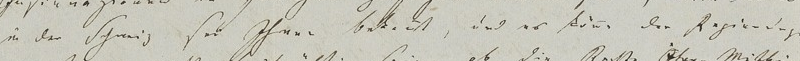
in der Schweiz sei Ihnen bekannt, und es könne der Regierung
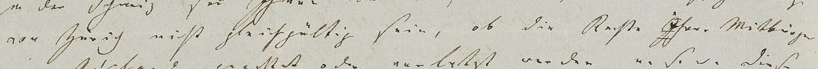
von Zürich nicht gleichgültig sein, als die Rechte ihrer Mitbürger
